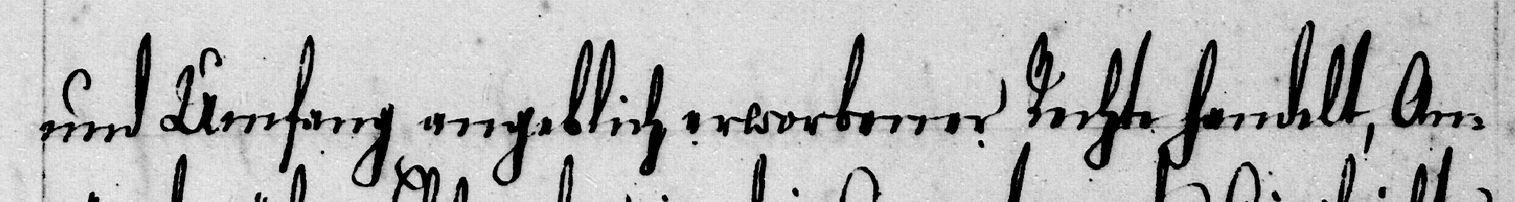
und Umfang angeblich erworbener Rechte handelt, An¬
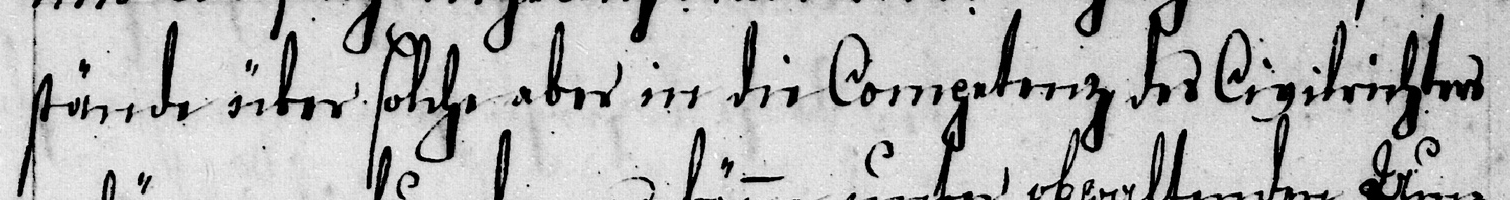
stände über solche aber in die Competenz des Civilrichters
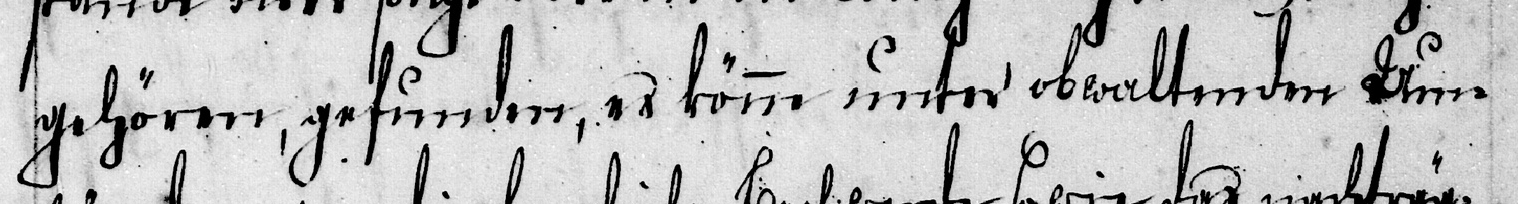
gehören, gefunden, es könne unter obwaltenden Um¬
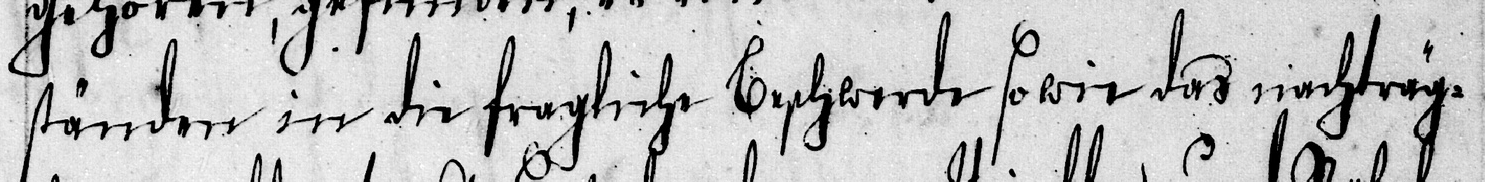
ständen in die fragliche Beschwerde sowie das nachträg¬
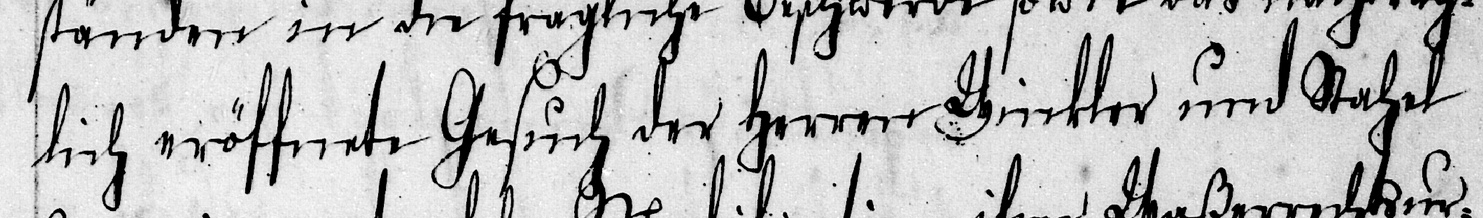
lich eröffnete Gesuch der Herren Winkler und Stahel
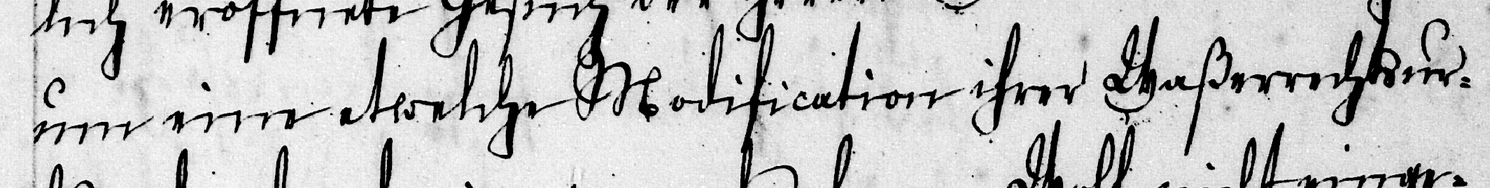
um eine etwelche Modification ihrer Waßerrechtsur¬
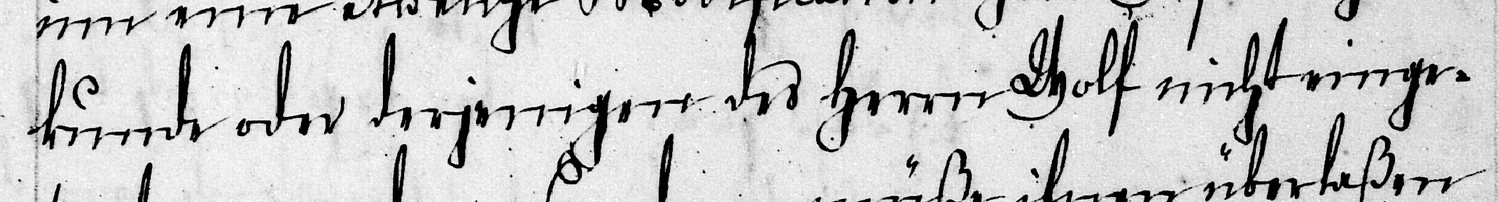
kunde oder derjenigen des Herrn Wolf nicht einge¬
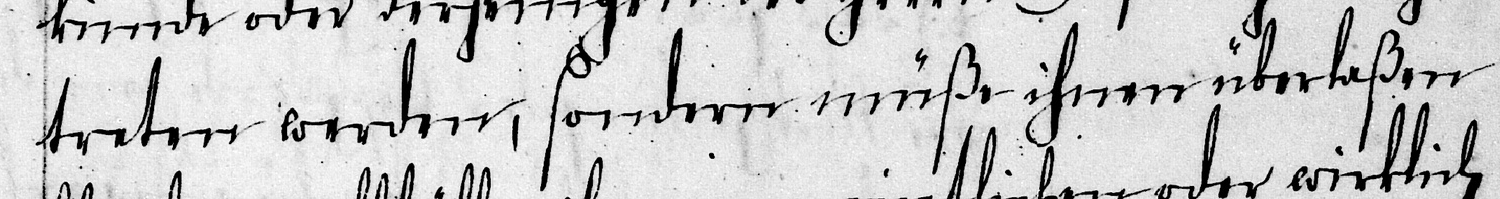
treten werden, sondern müße ihnen überlaßen
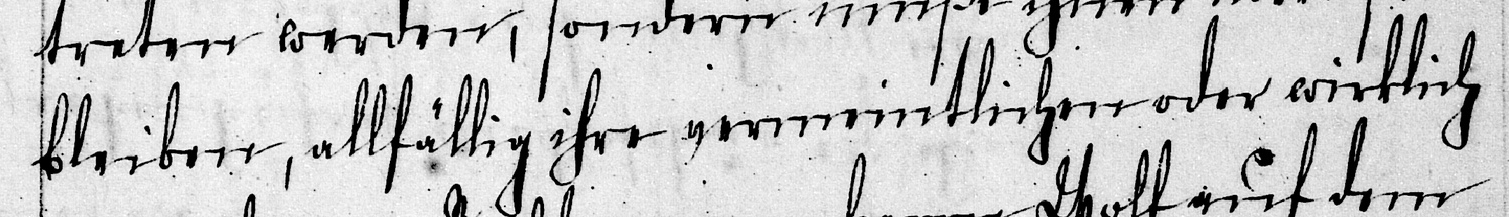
bleiben, allfällig ihre vermeintlichen oder wirklich
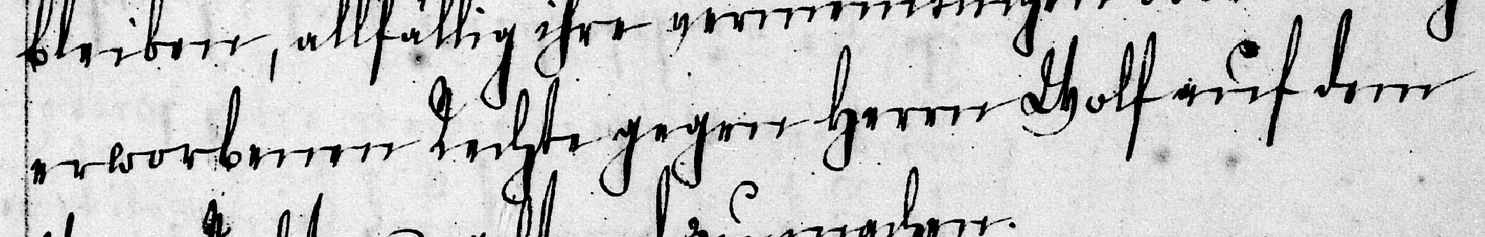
erworbenen Rechte gegen Herrn Wolf auf dem
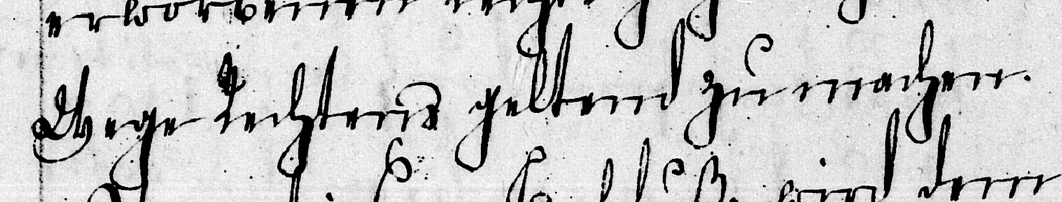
Wege Rechtens geltend zu machen.
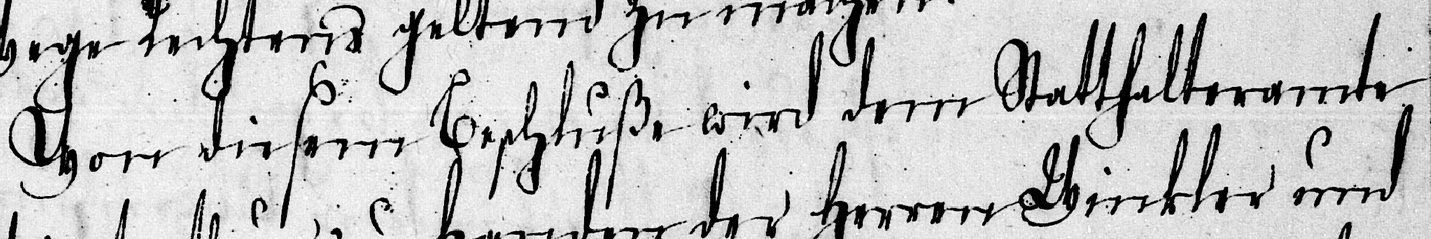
Von diesem Beschluße wird dem Statthalteramte
